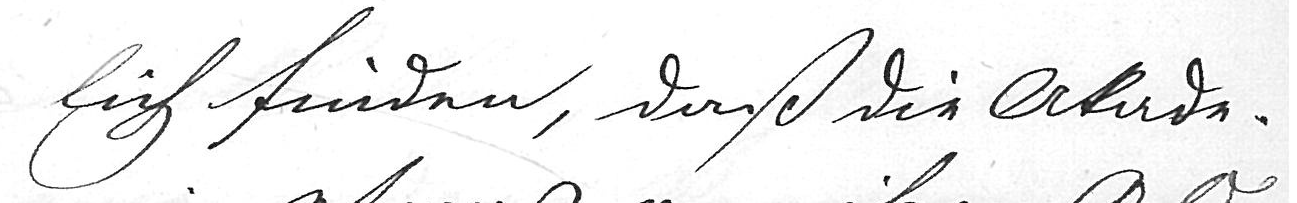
lich finden, daß die Akade-
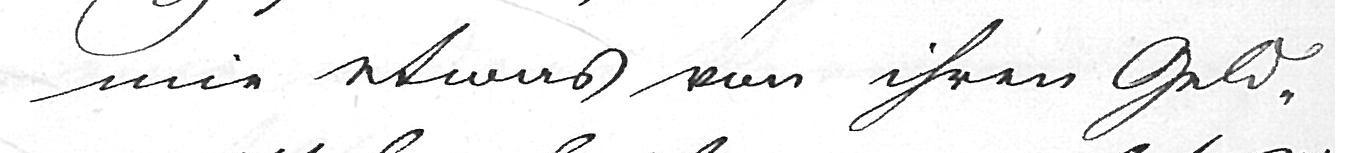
mie etwas von ihren Geld-
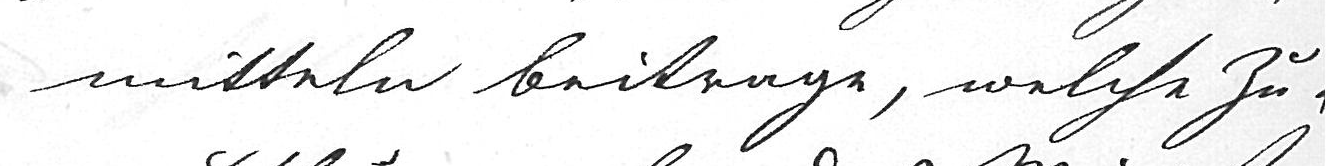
mitteln beitrage, welche Zu-
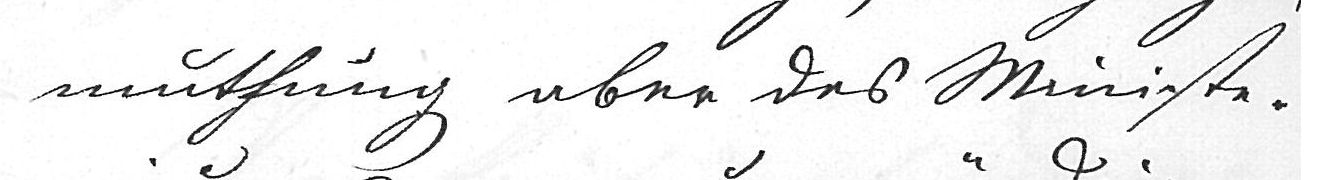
muthung aber des Ministe-
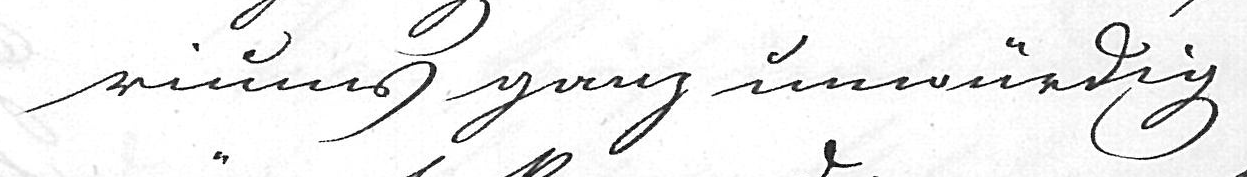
riums ganz unwürdig
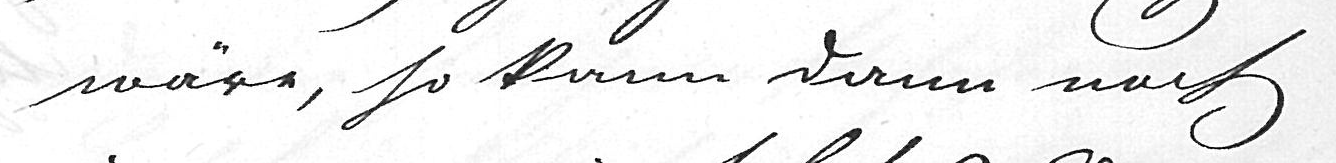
wäre, so kann dann noch
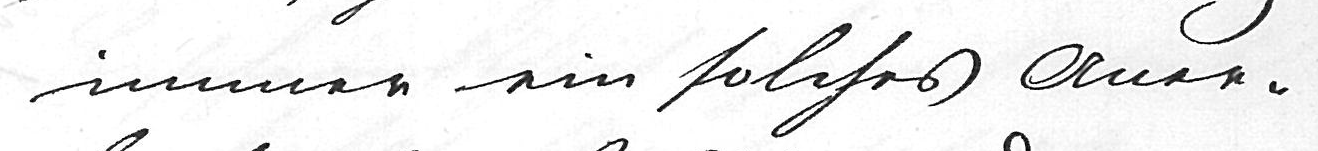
immer ein solches Aner-
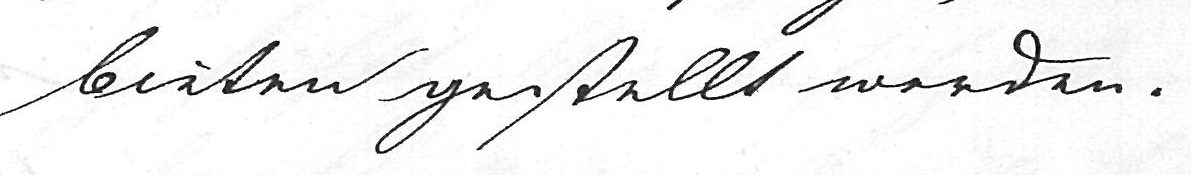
bieten gestellt werden.
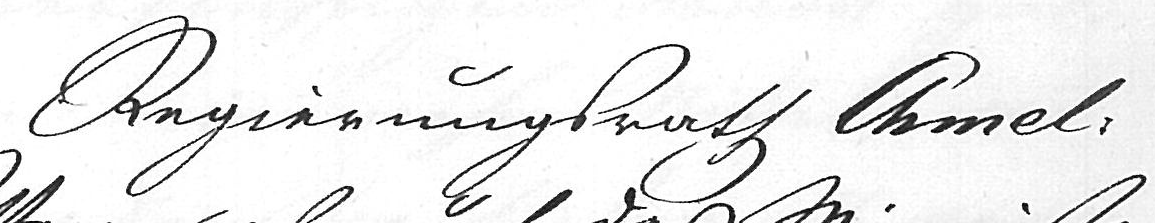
Regierungsrath Chmel:
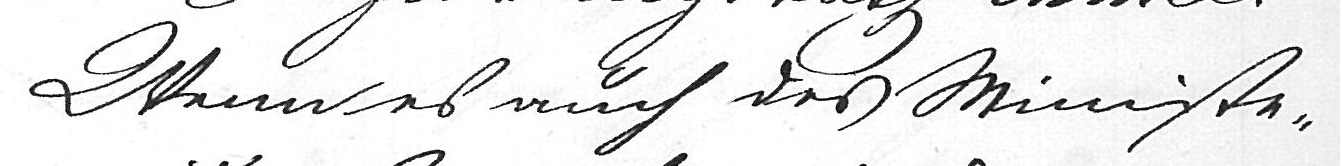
Wenn es auch des Ministe-
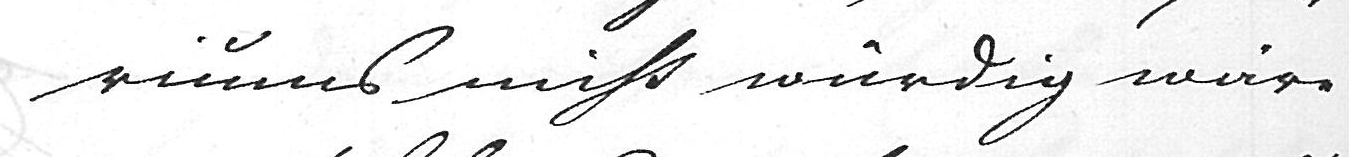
riums nicht würdig wäre
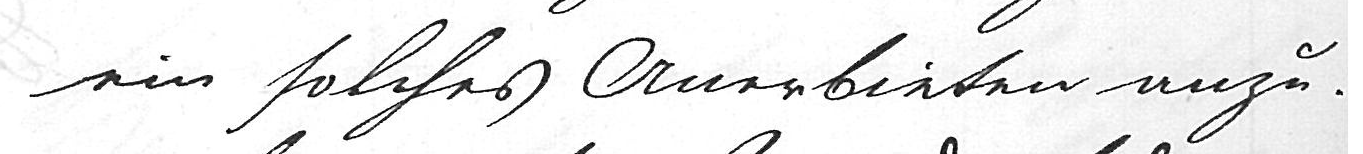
ein solches Anerbieten anzu-
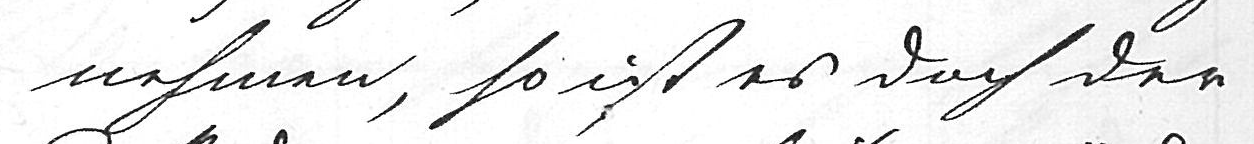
nehmen, so ist es doch der
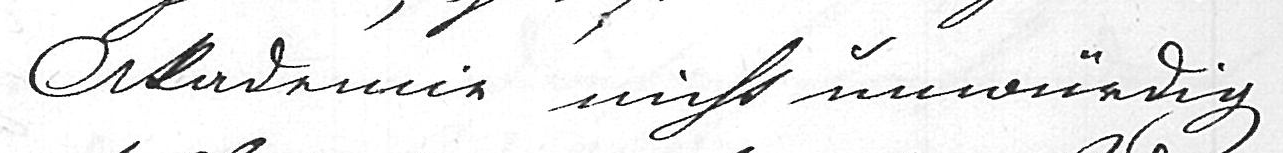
Akademie nicht unwürdig
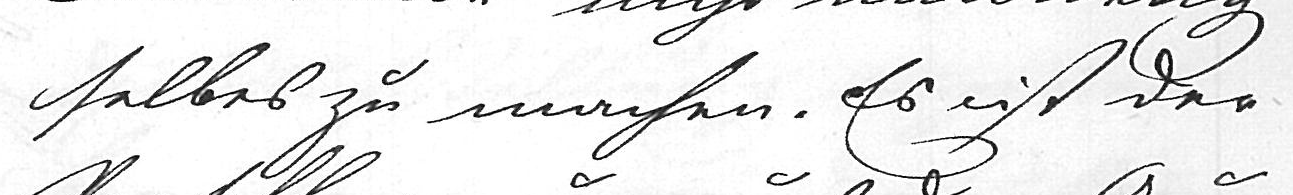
selbes zu machen. Es ist der
